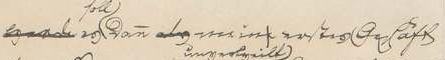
werde es soll dann als meine erstes Geschäft
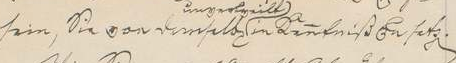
sein, Sie von demselben unverweilt in Kenntniß zu setzen.
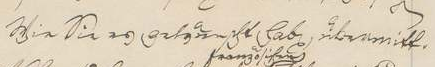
Wie Sie es gewünscht haben, übermitt-
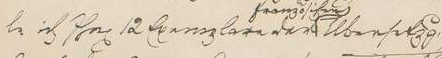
le ich Ihnen 12 Exemplare der französischen
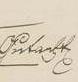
richten ds
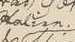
Italien.
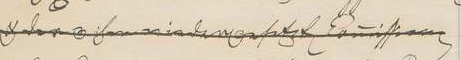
& der v. ihm niedergesetzten Commissionen
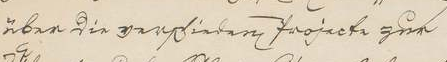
über die verschiedenen Projecte zur
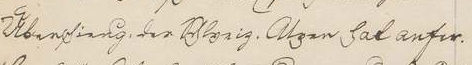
Überschieng. der Schweiz. Alpen hat anfer-
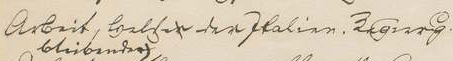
Arbeit, welcher der Italien. Regierg.
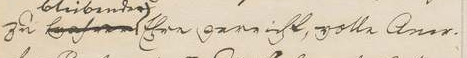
zu wahrerbleibender Ehre gereicht, volle Aner-
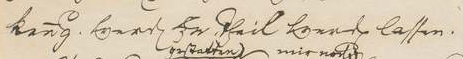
kenng. werden zu Theil werden lassen.
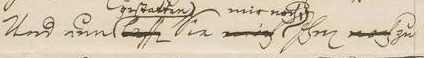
Und nun lassengestatten Sie michmir noch Ihnen noch zu
